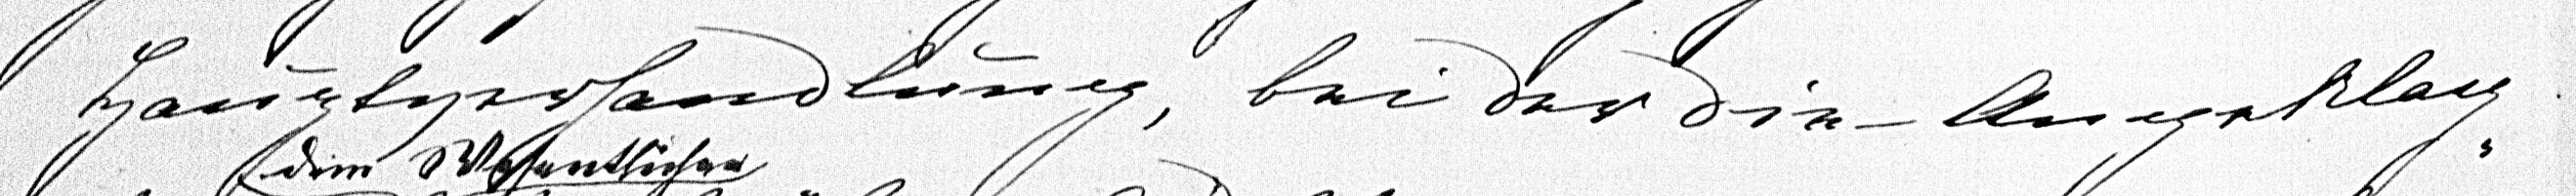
Hauptverhandlung, bei der die Angeklag¬
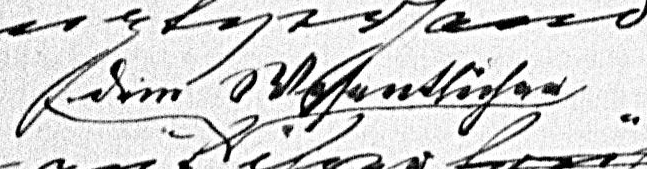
dem Wesentlicher
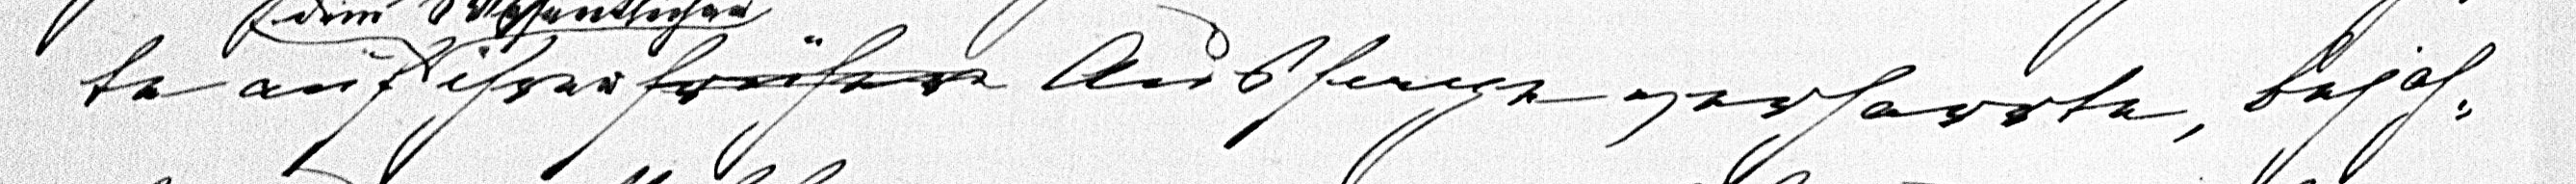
te auf ihrer Aussage verharrte, Bejah¬
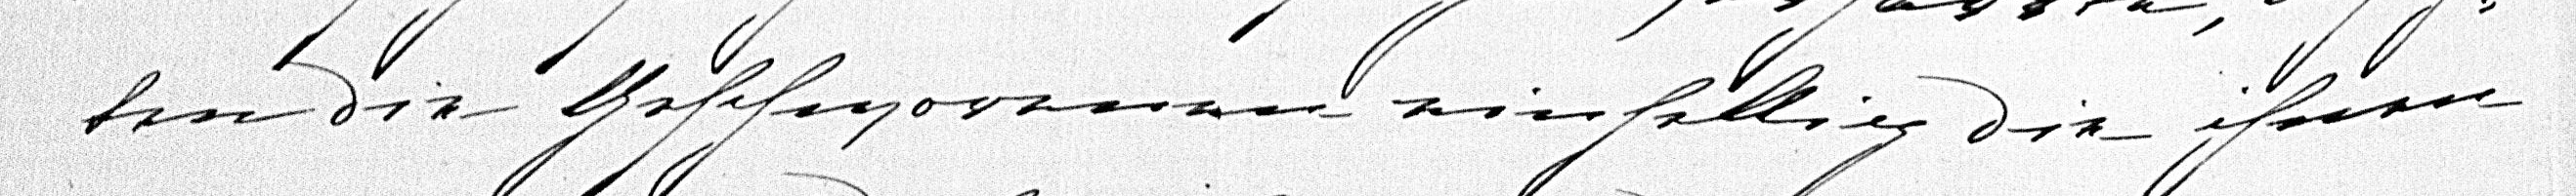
ten die Geschworenen einhellig die ihnen
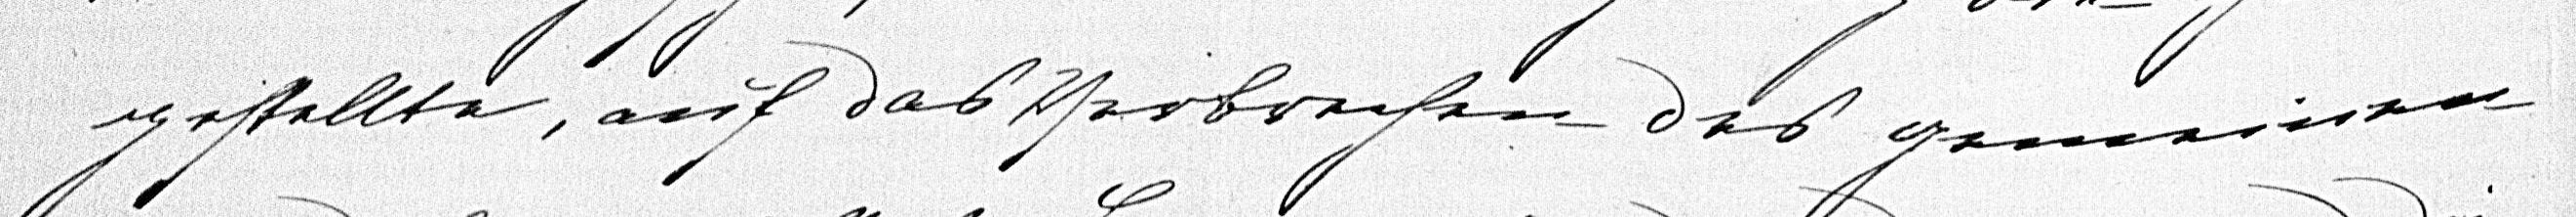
gestellte, auf das Verbrechen des Gemeinen
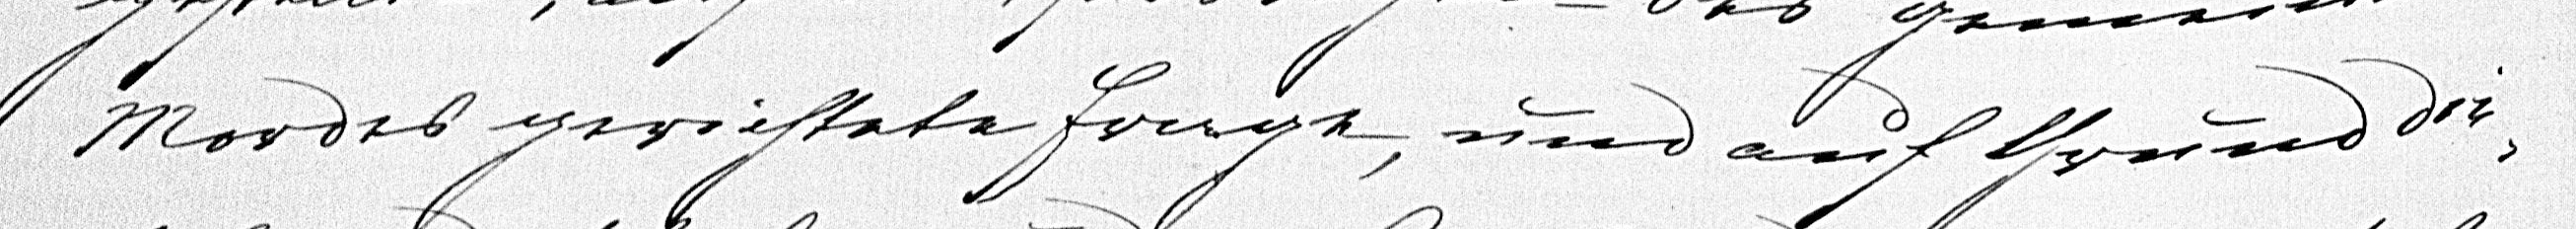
Mordes gerichtete Frage, und auf Grund die¬
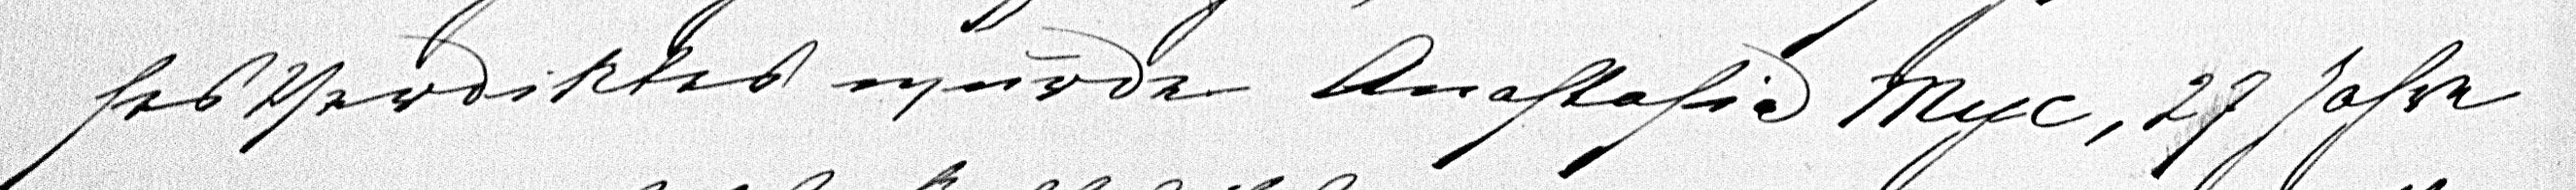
ses Verdiktes wurde Anastasie Myc, 27 Jahre
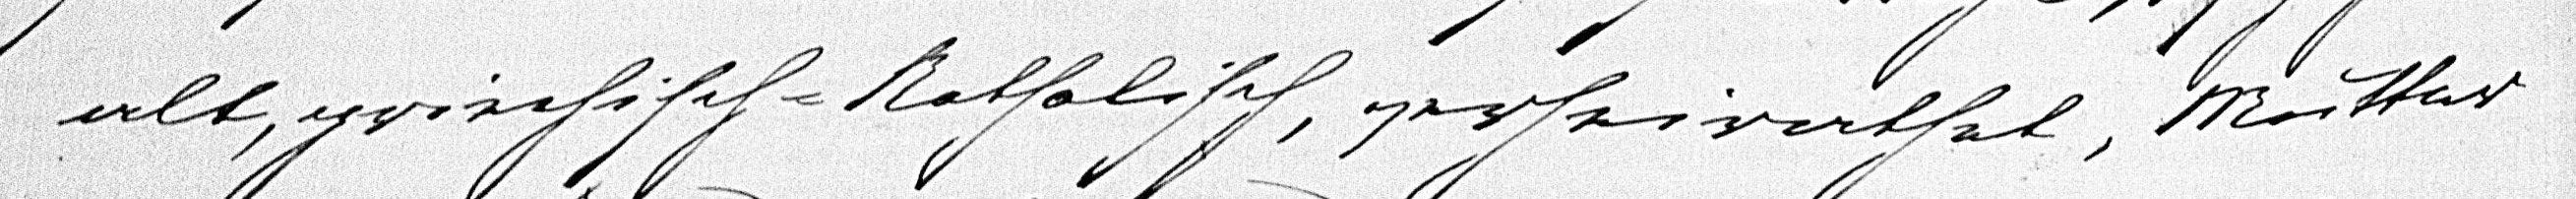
alt, griechisch-katholisch, verheirathet, Mutter
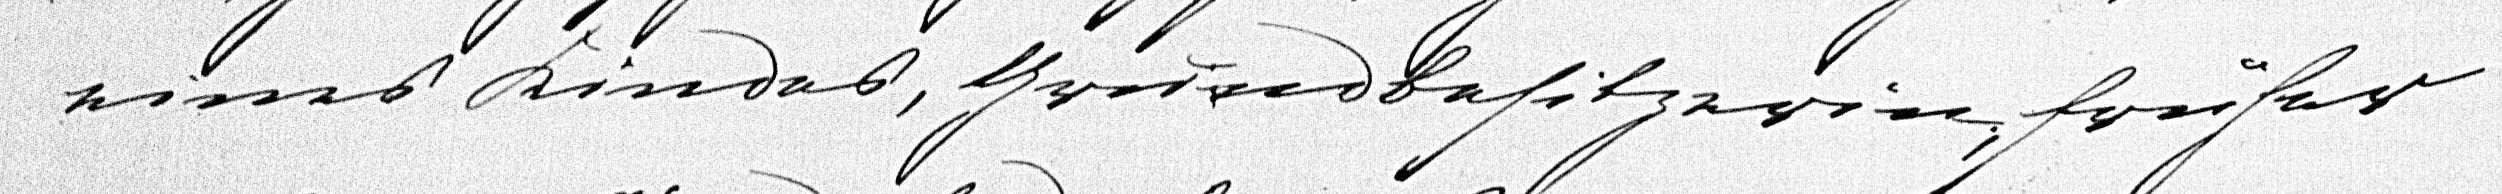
eines Kindes, Grundbesitzerin, früher
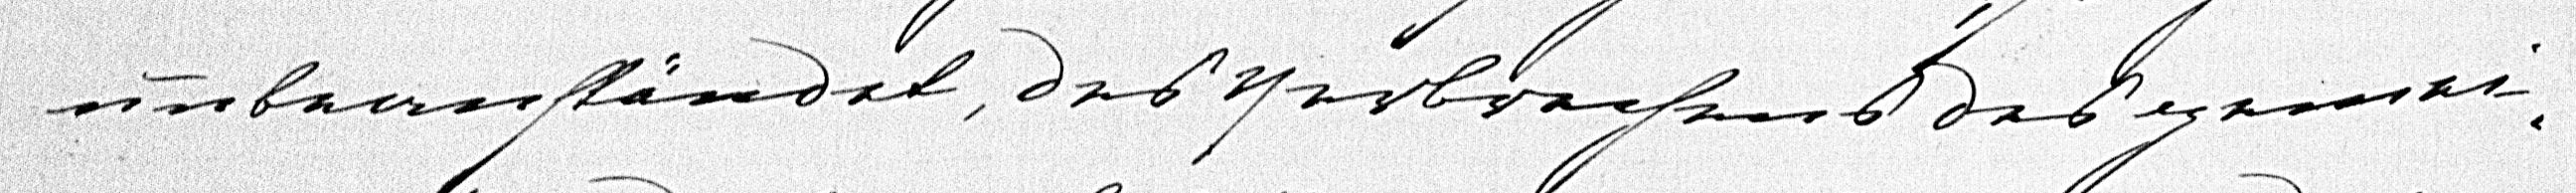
unbeanständet, des verbrechens des gemei¬
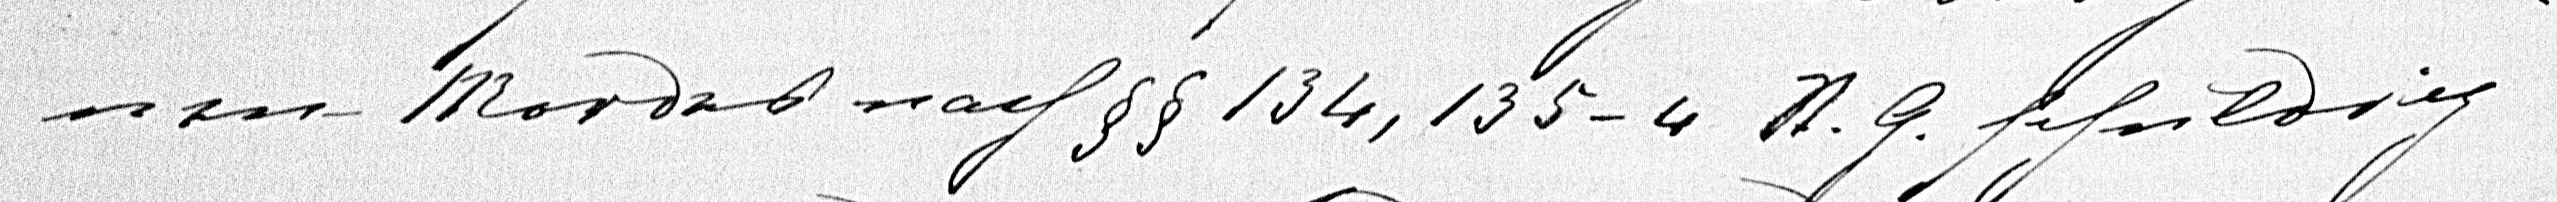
nen Mordes nach §§ 134, 135-4 St. G. schuldig
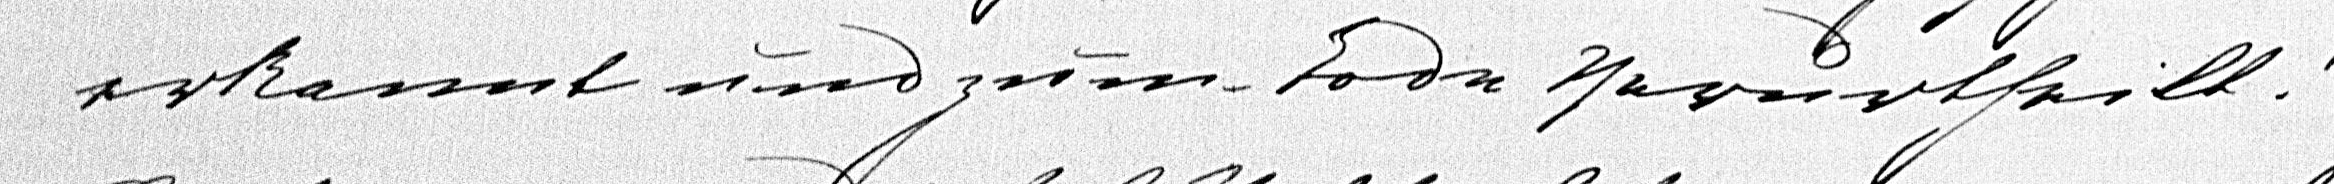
erkannt und zum Tode verurtheilt.
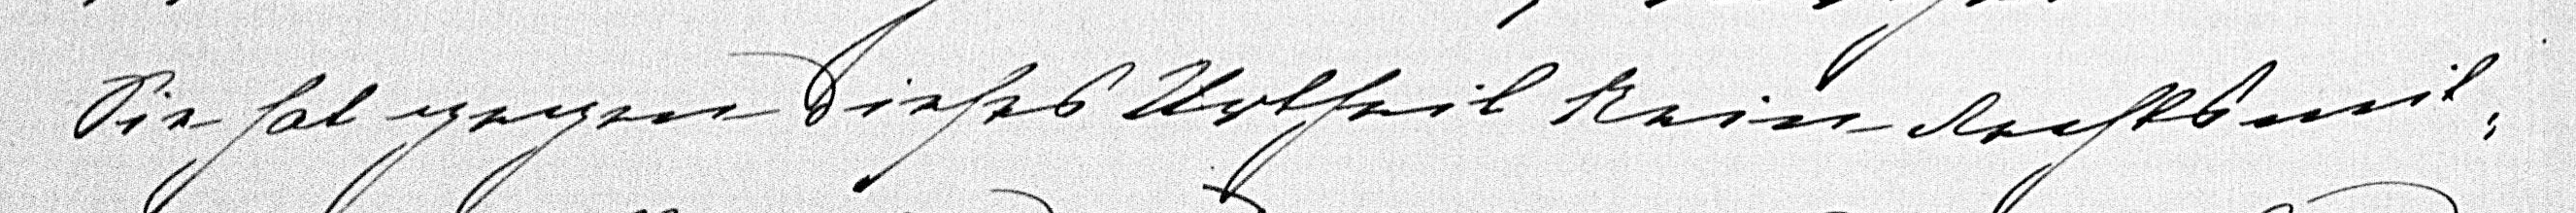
Sie hat gegen dieses Urtheil kein Rechtsmit¬
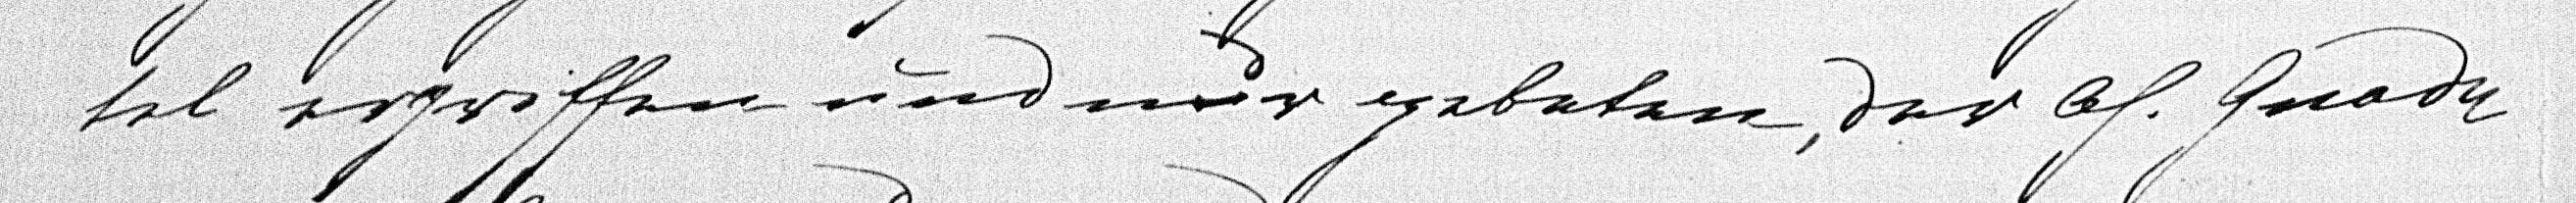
tel ergriffen und nur gebeten, der Ah. Gnade
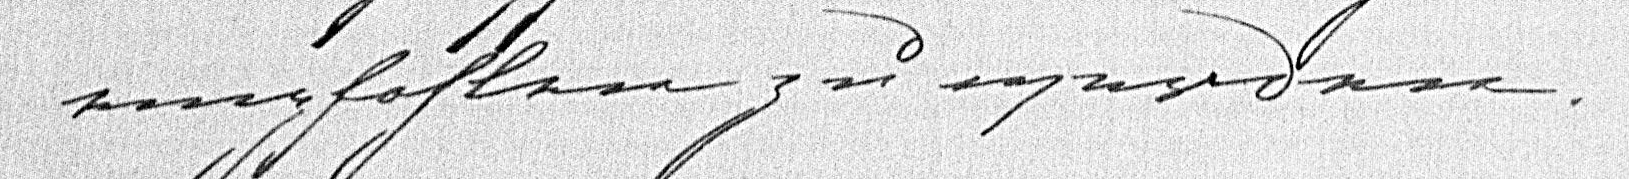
empfohlen zu werden.
